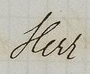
Herr.
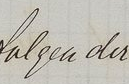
folgender
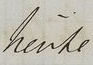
Bericht
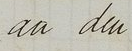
an den
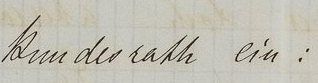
Bundesrath ein:
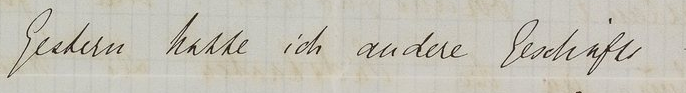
«Gestern hatte ich andere Geschäfte
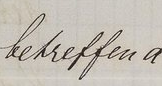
betreffend
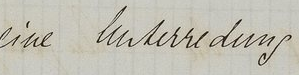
eine Unterredung
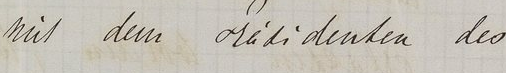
mit dem Präsidenten des
